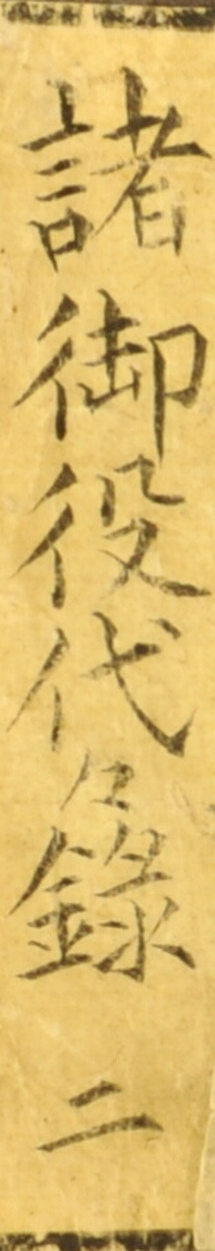諸御役代々録二

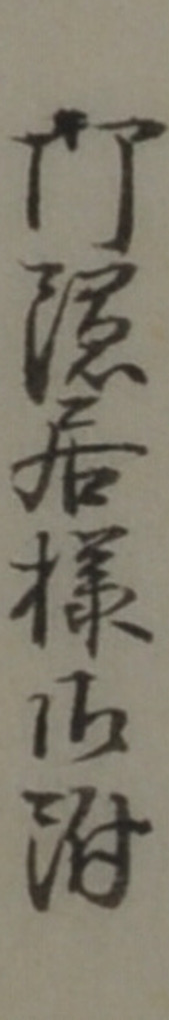御隠居様御附
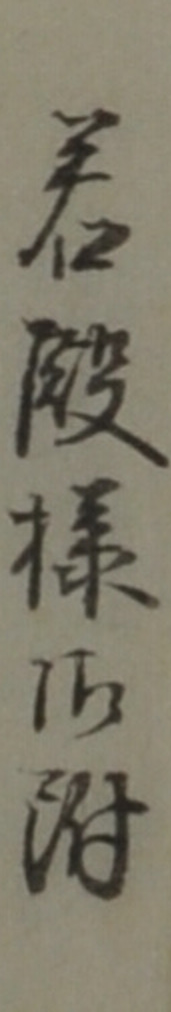若殿様御附
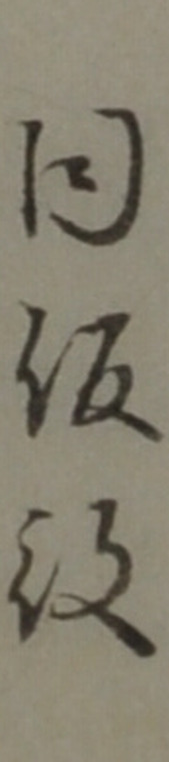同仮役
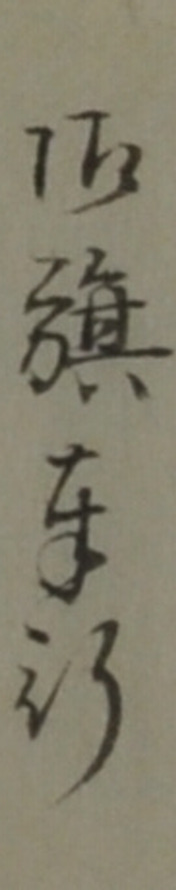御旗奉行
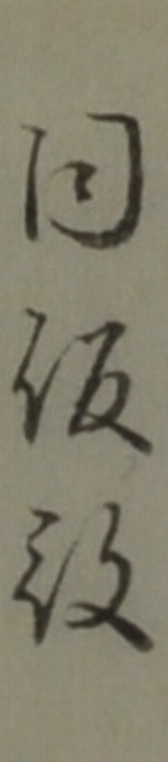同仮役
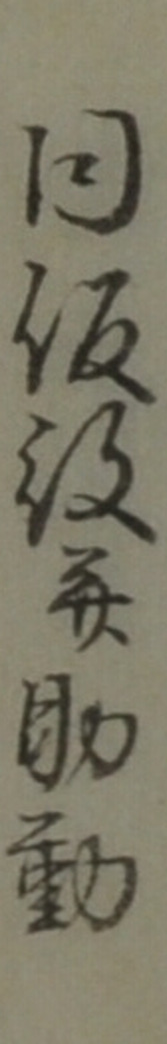同仮役并助勤
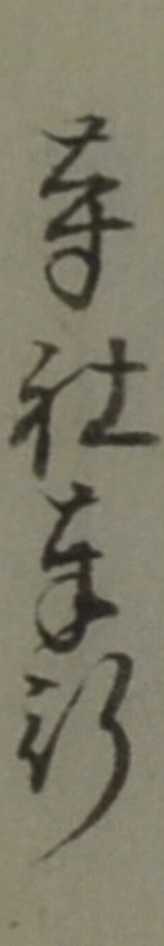寺社奉行
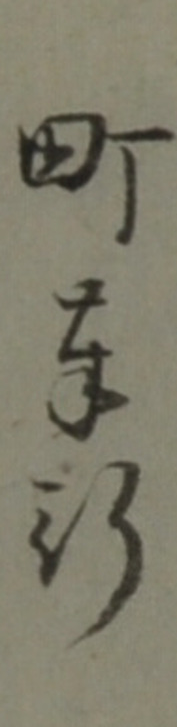町奉行
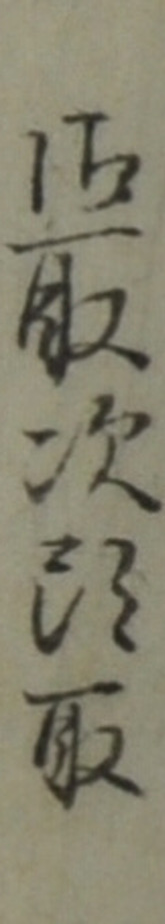御取次頭取
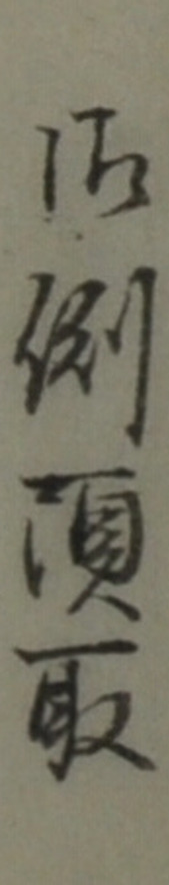御側頭取
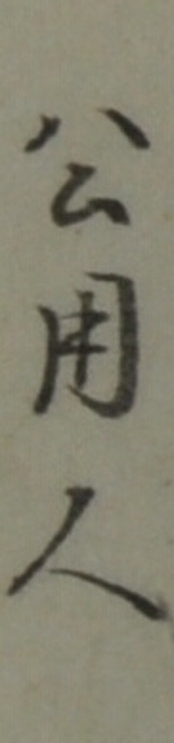公用人

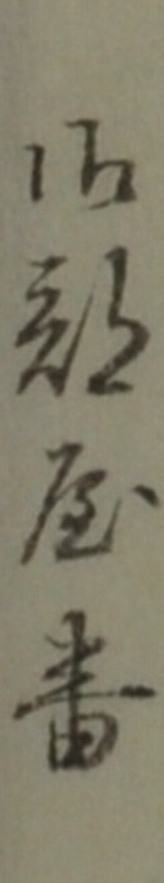御部屋番
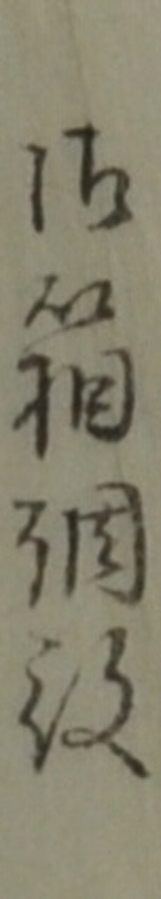御箱調役
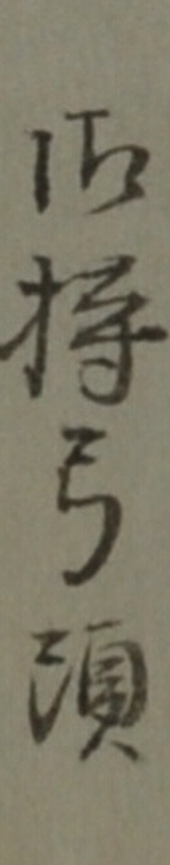御持弓頭
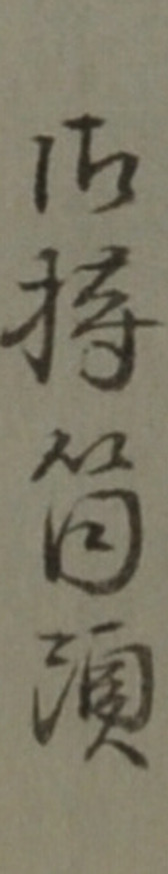御持筒頭
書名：諸御役代々録（二）
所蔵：伊那市立高遠町図書館・合同会社AMANE
